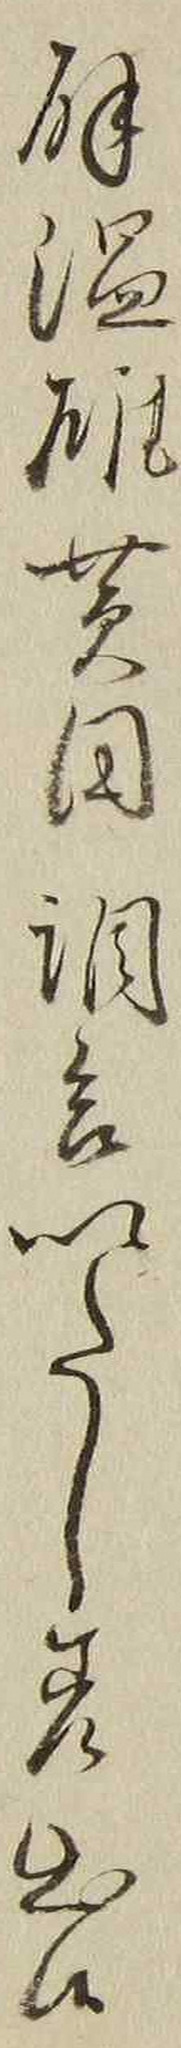解温雄黄回調合いたし差出候
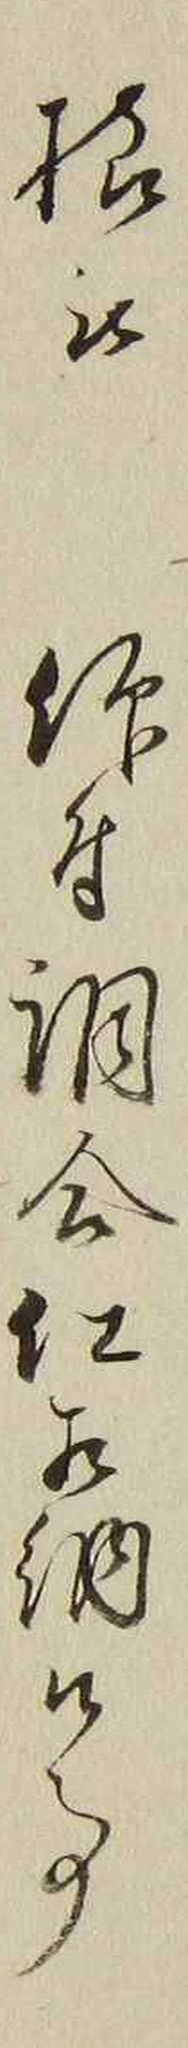様被仰付調合仕相納候事
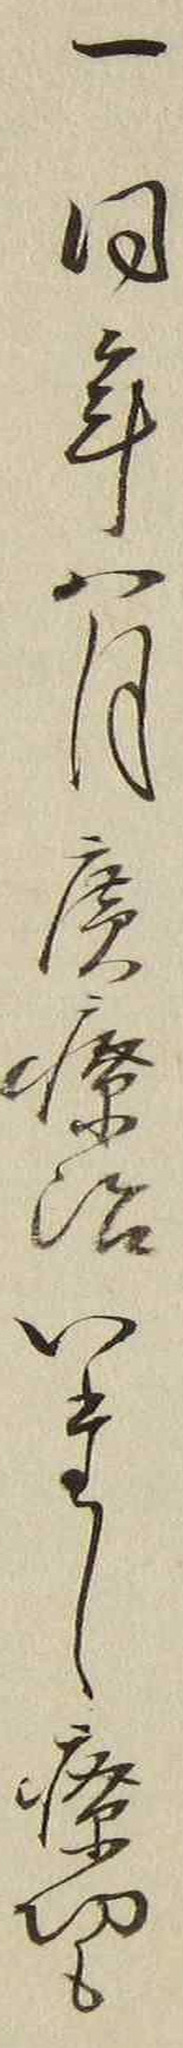一同年八月広療治いたし療功も
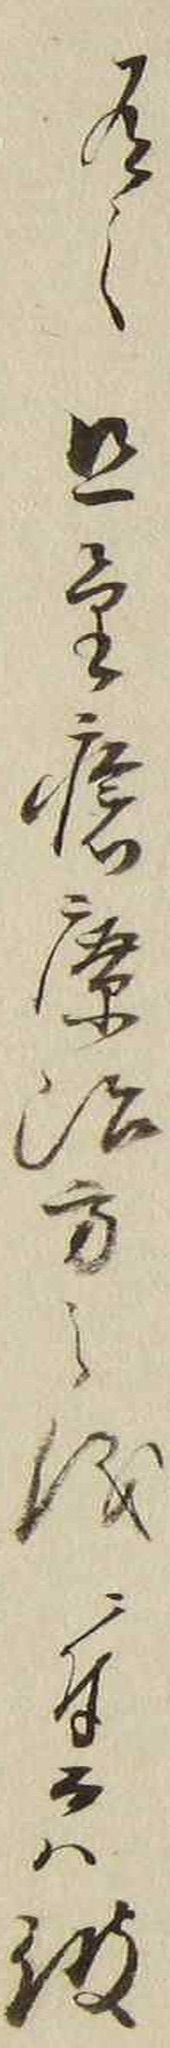有之但金瘡療治方之儀ニ付而ハ彼

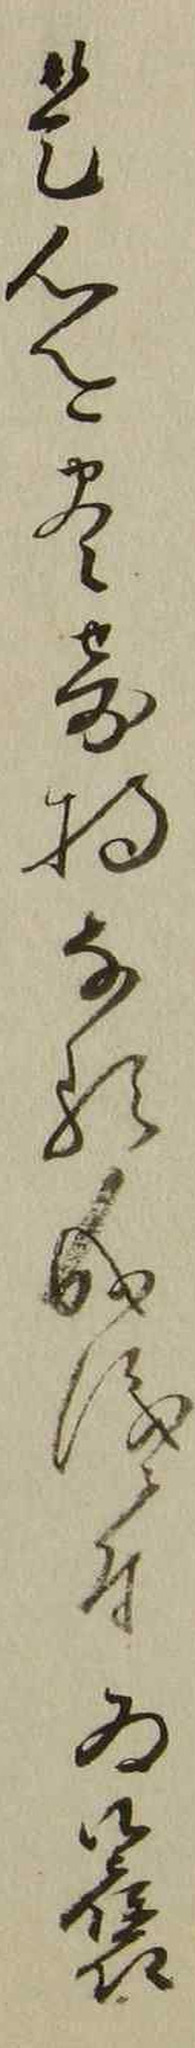是心を尽寄特なる成儀ニ付為御褒
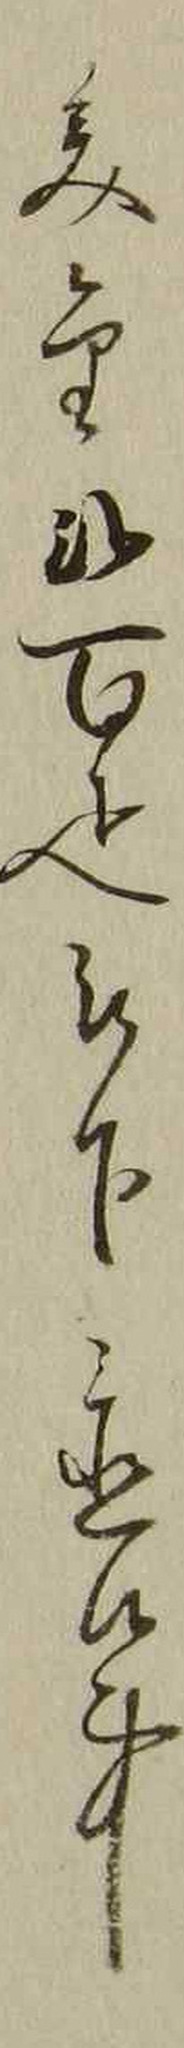美金弐百疋被下置候事
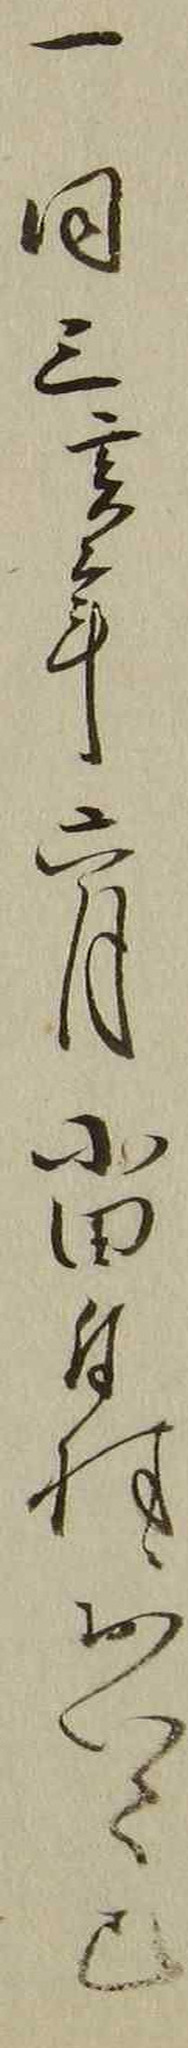一同三亥年六月小田付村ニおいて巳
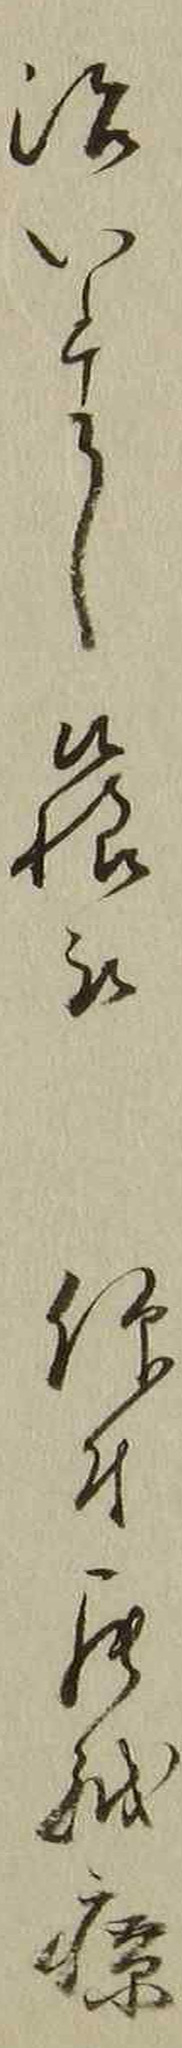治いたし候様被仰付罷越療
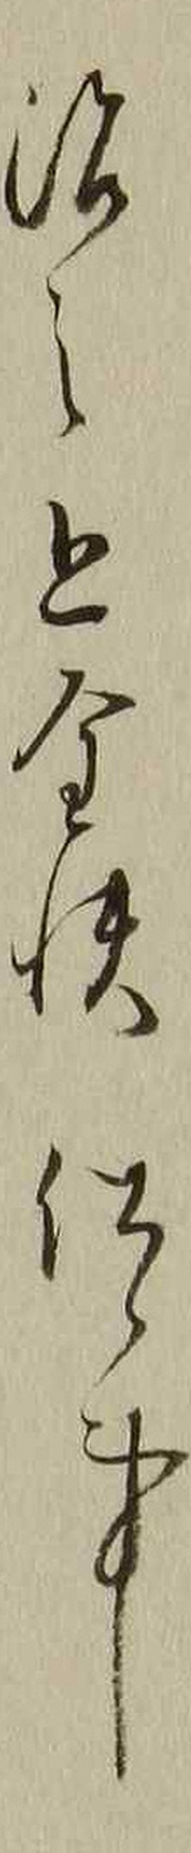治之上全快仕候事
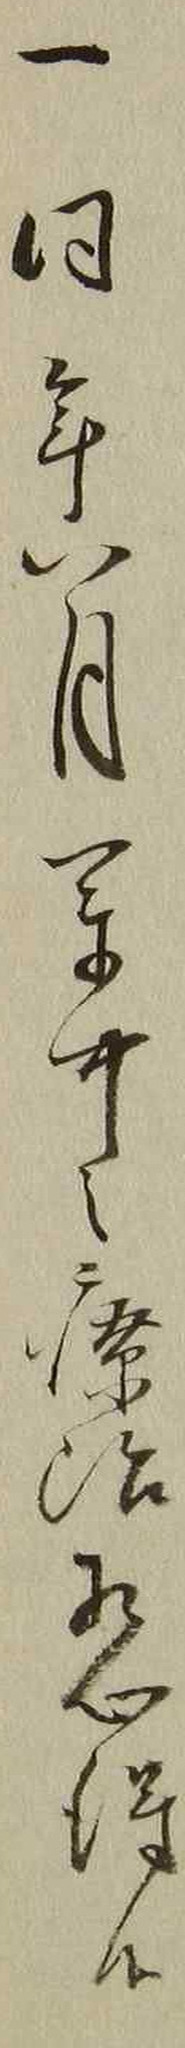一同年八月軍中之療治相心得候
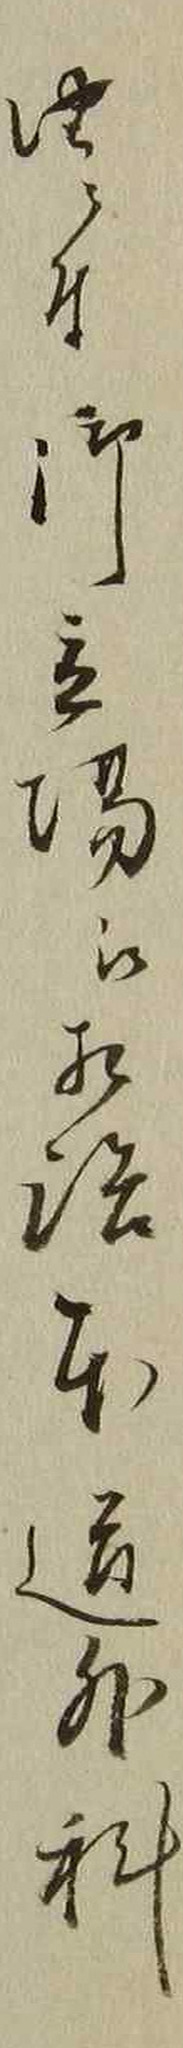由ニ付御立場被相詰本道外科
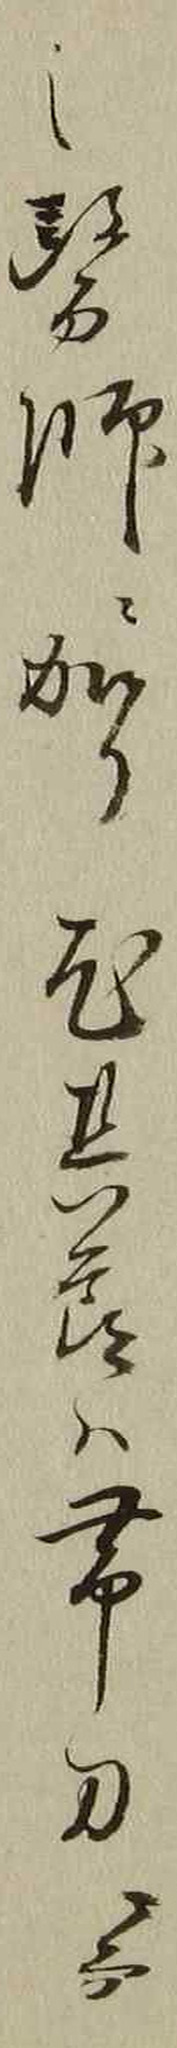之医師ニ加り尤其節ハ帯刀ニ而
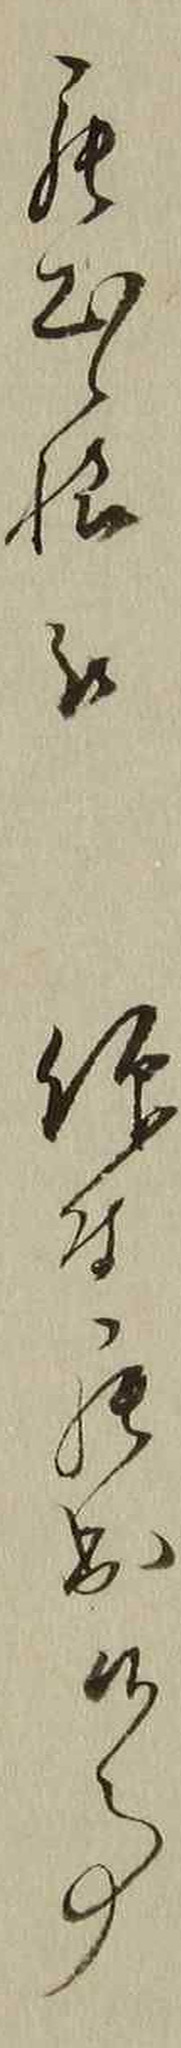罷出様被仰付罷出候事
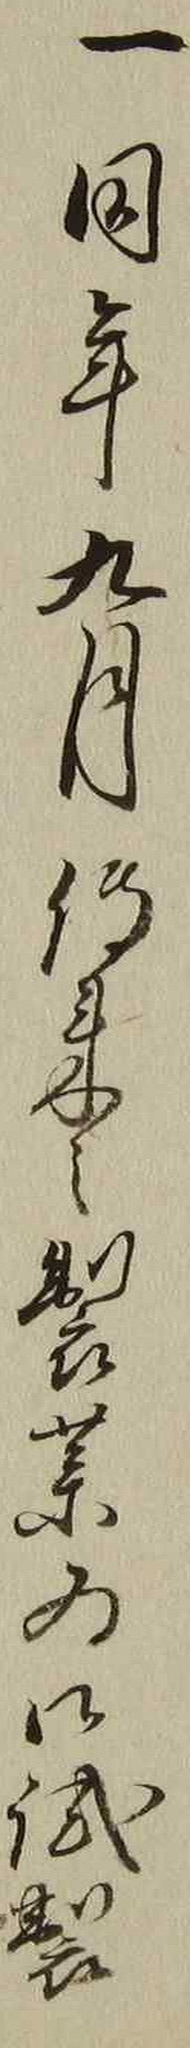一同年九月伝来之製薬為御試製
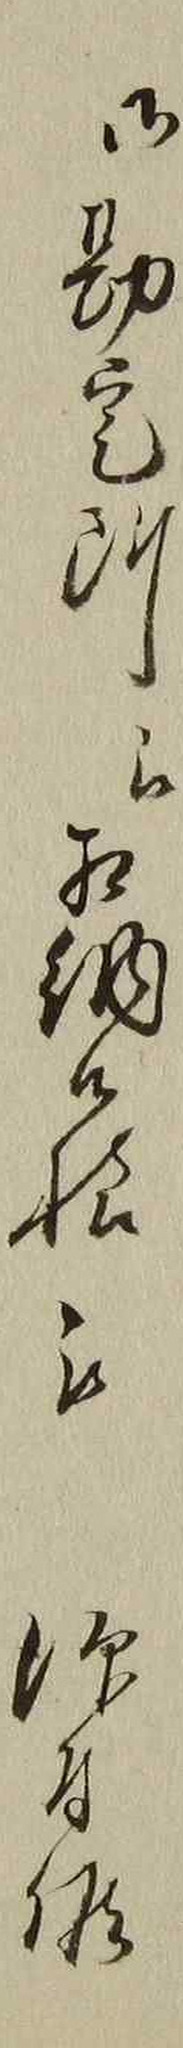御勘定所江相納候様被仰付候
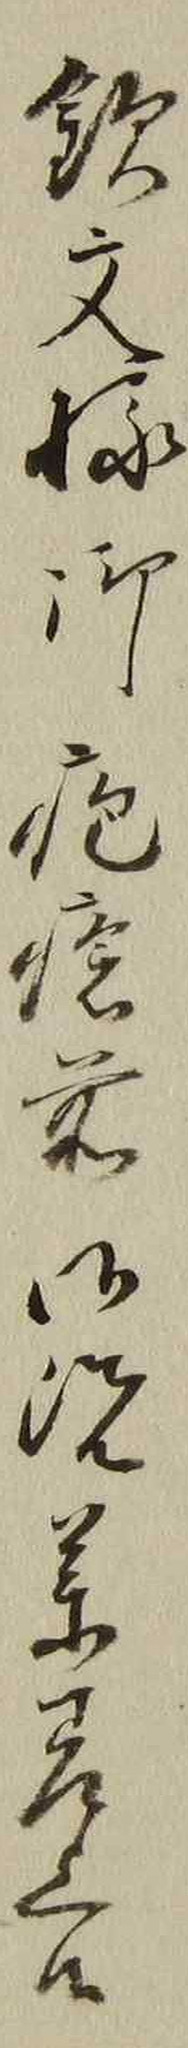欽文様御疱瘡前御洗薬差上候
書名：諸士系譜　巻之129　た之部5
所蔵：会津若松市立会津図書館
